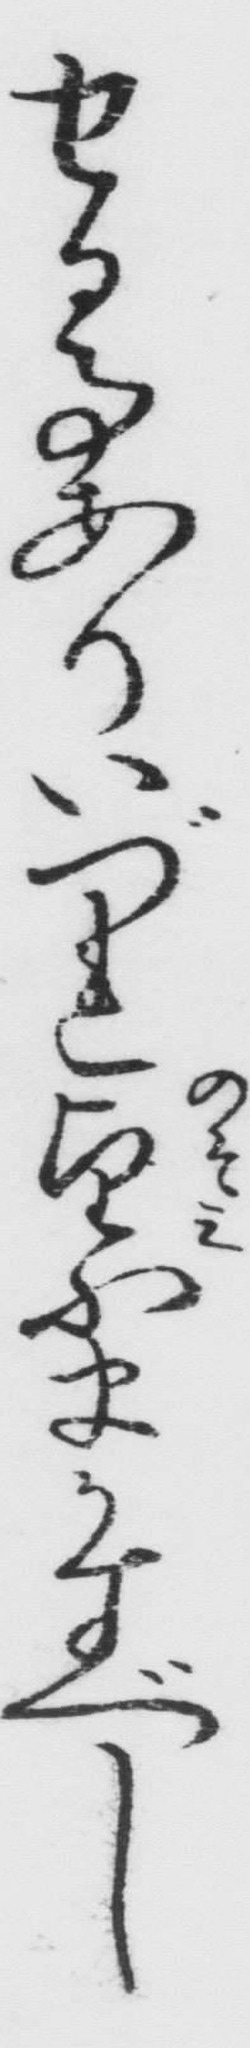せる事ありいづれ望にまかすべし
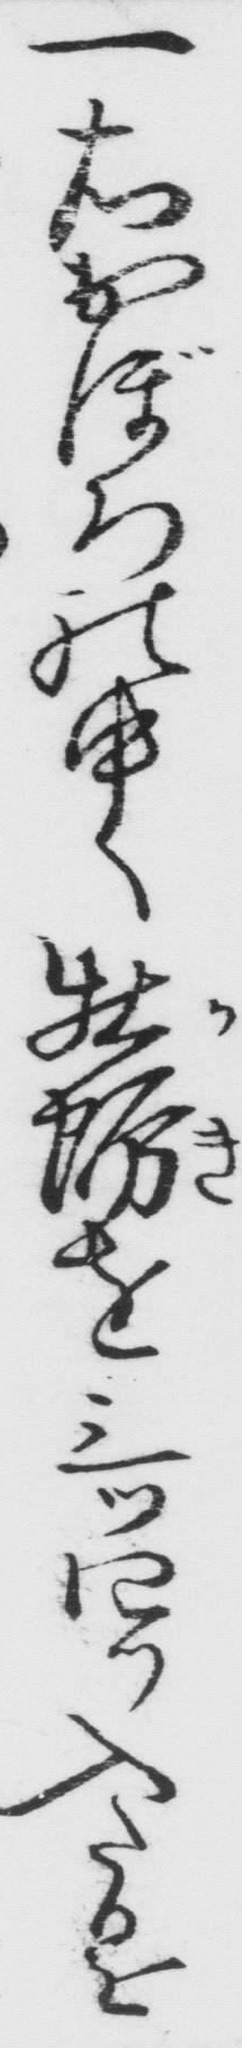一右おぼろの中へ牡蠣を三つ四つ入たるを
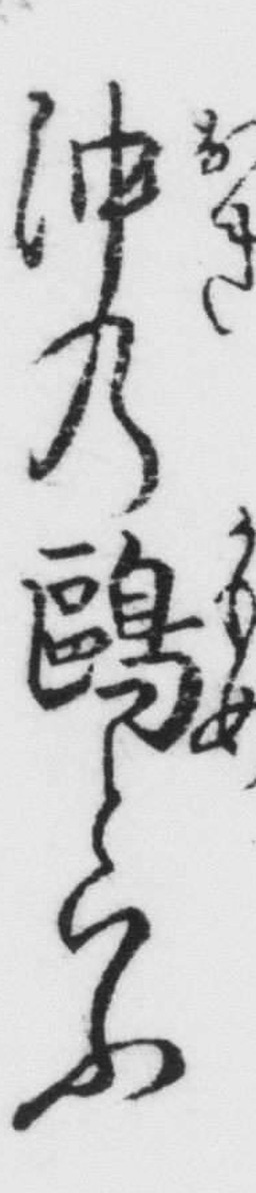沖の鷗といふ
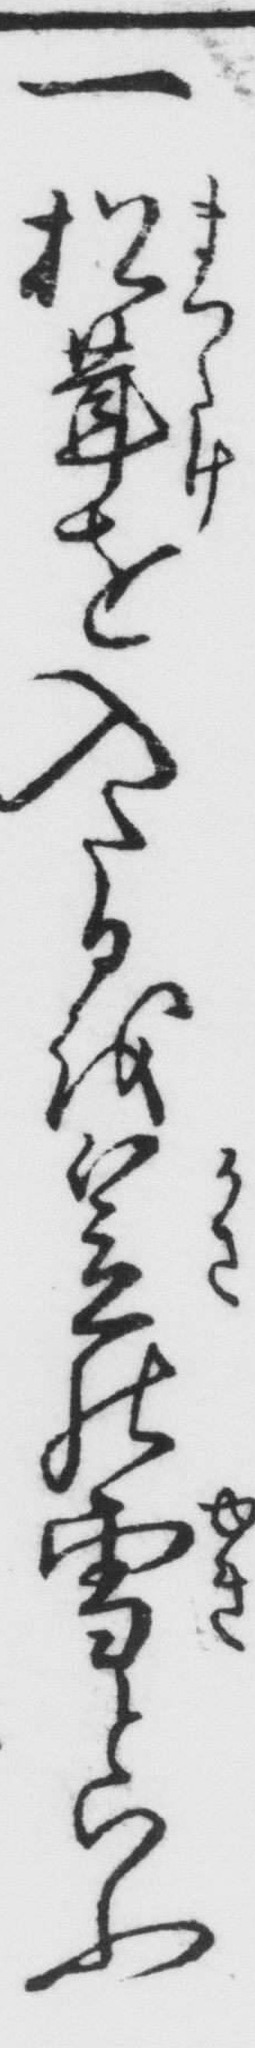一松茸を入たるを笠の雪といふ
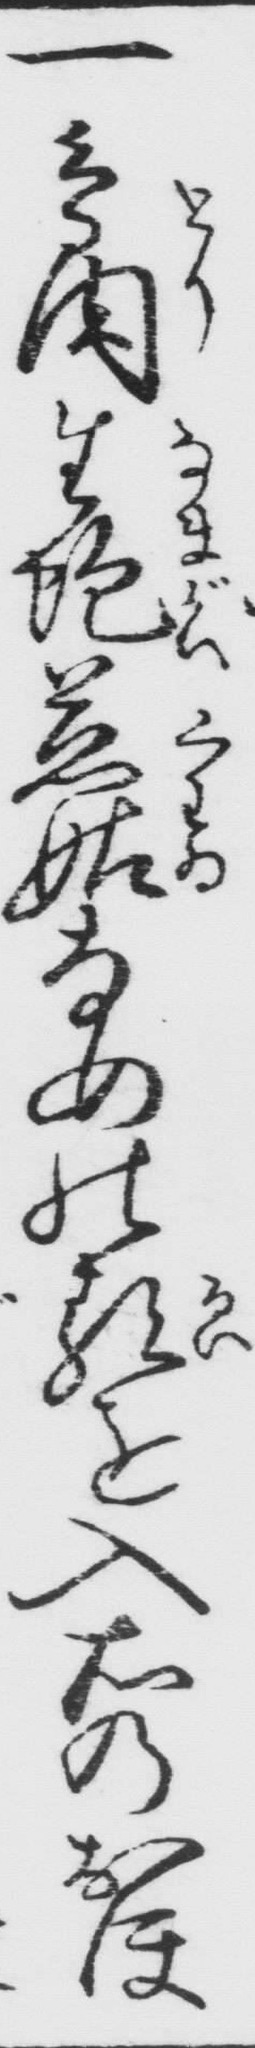一鳥肉生蚫慈姑なめの類を入右のおほ
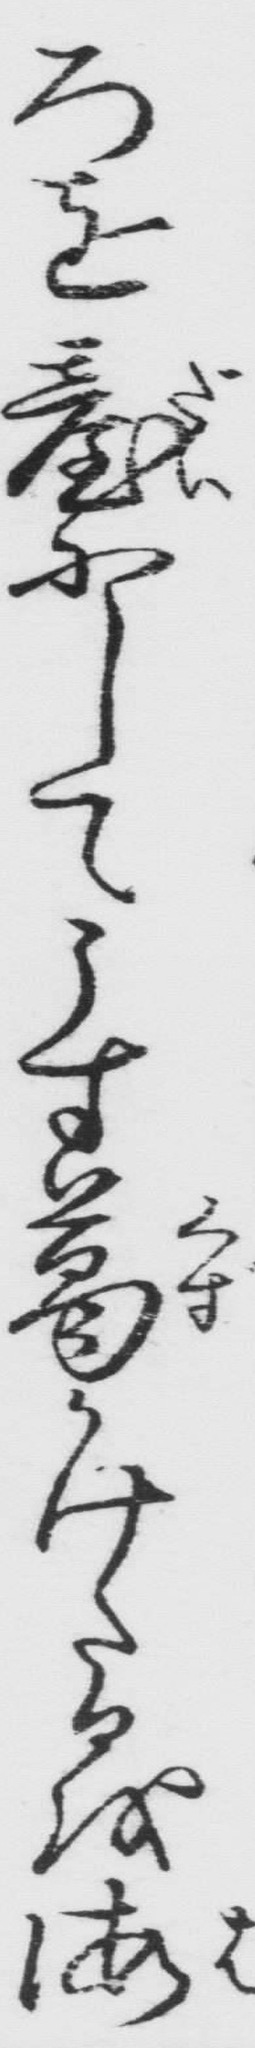ろを臺にしてうす葛かけたるを海
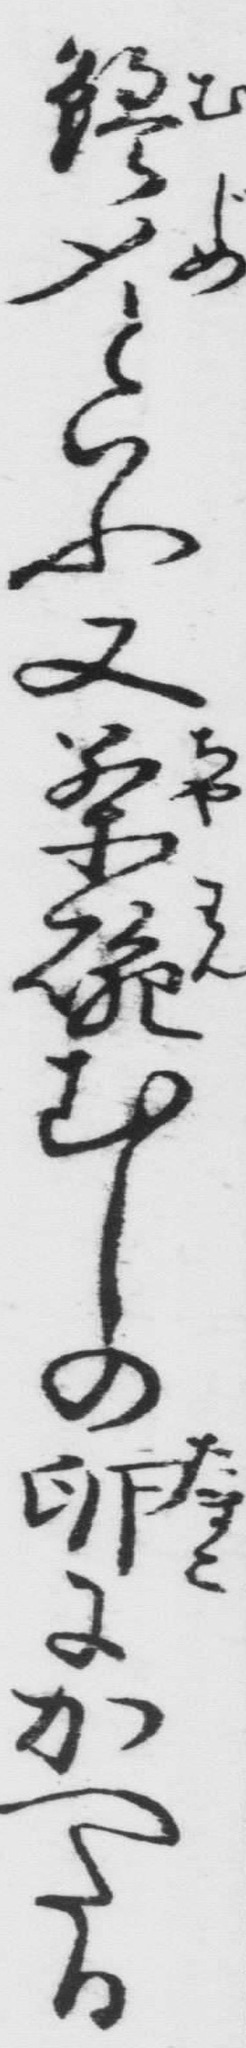鱧〆といふ又茶碗むしの卵にかへたる
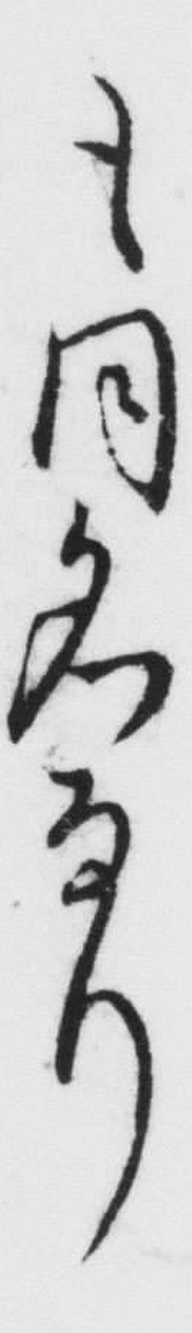も同名なり
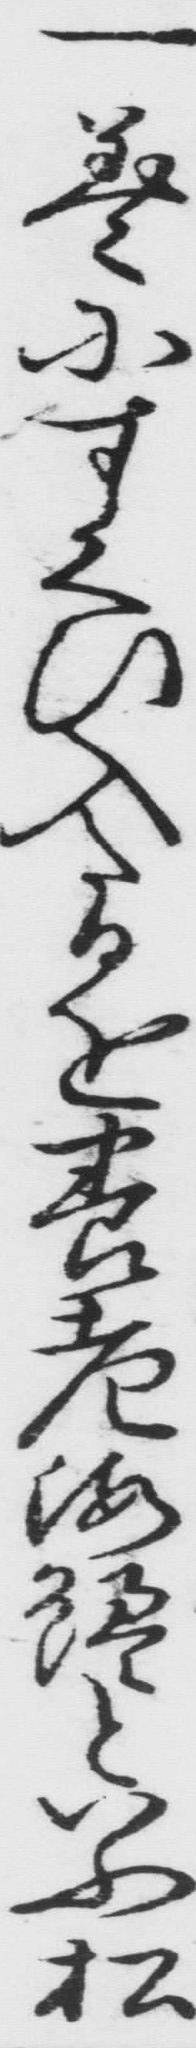一羹にすくひ入たるを養老海鱧といふ松
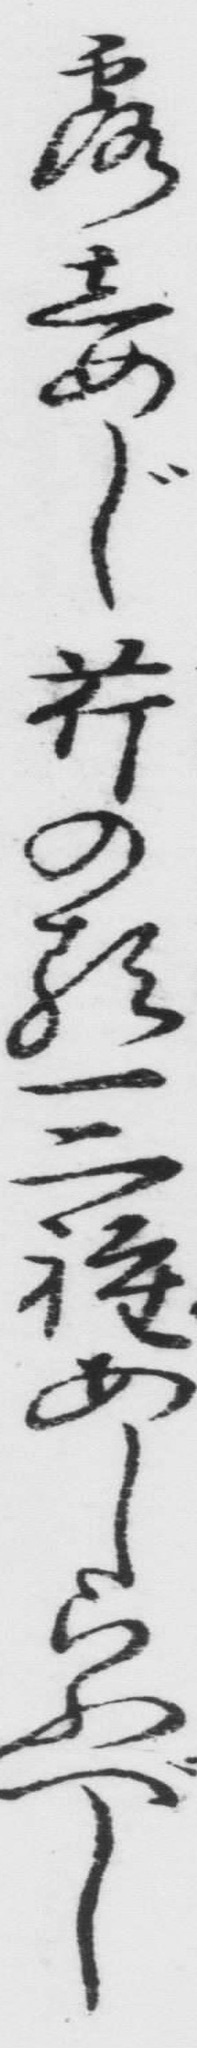露しめじ芹の類一二種あしらふべし
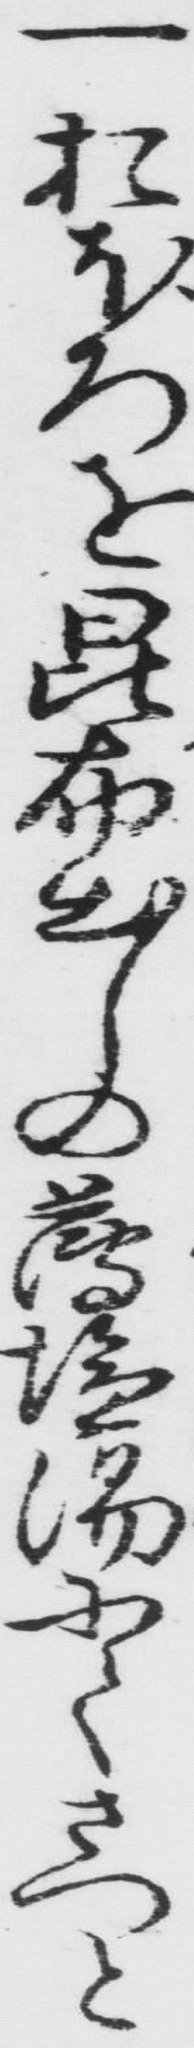一おぼろを昆布出しの薄塩湯にてさつと
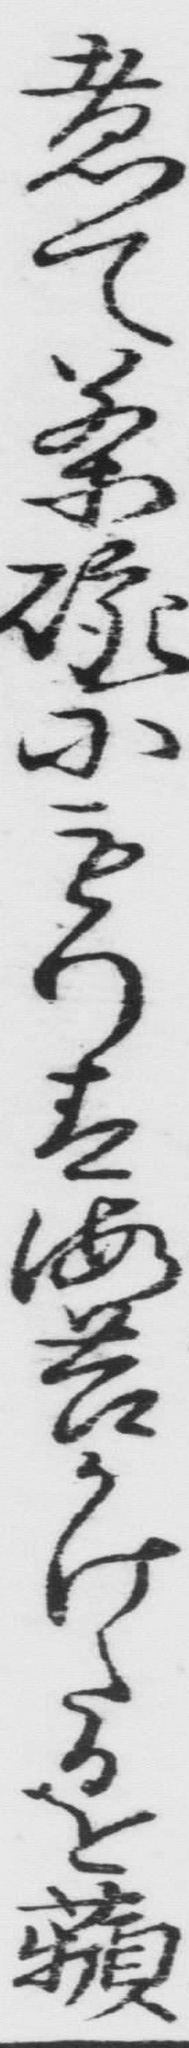煮て茶碗にもり青海苔かけたるを蘋
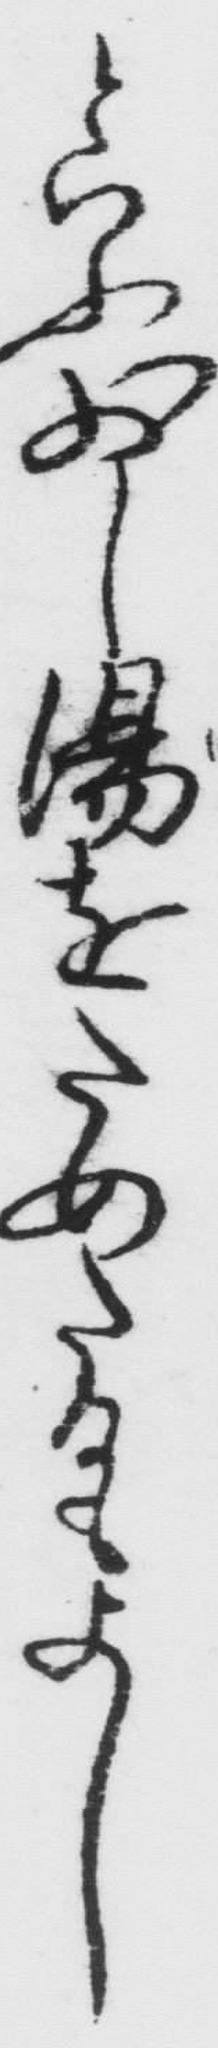といふ少し湯をためたるもよし

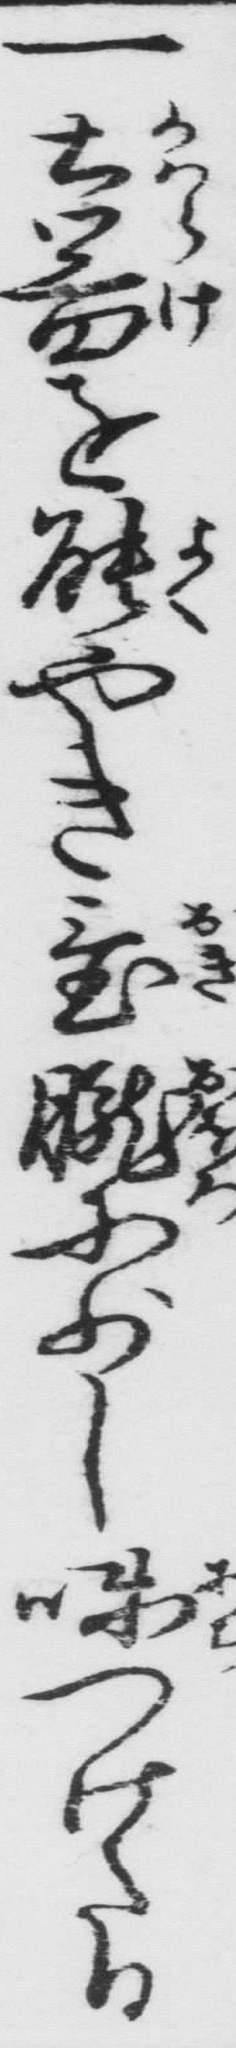一土器を能やき置朧に少し味つけたる
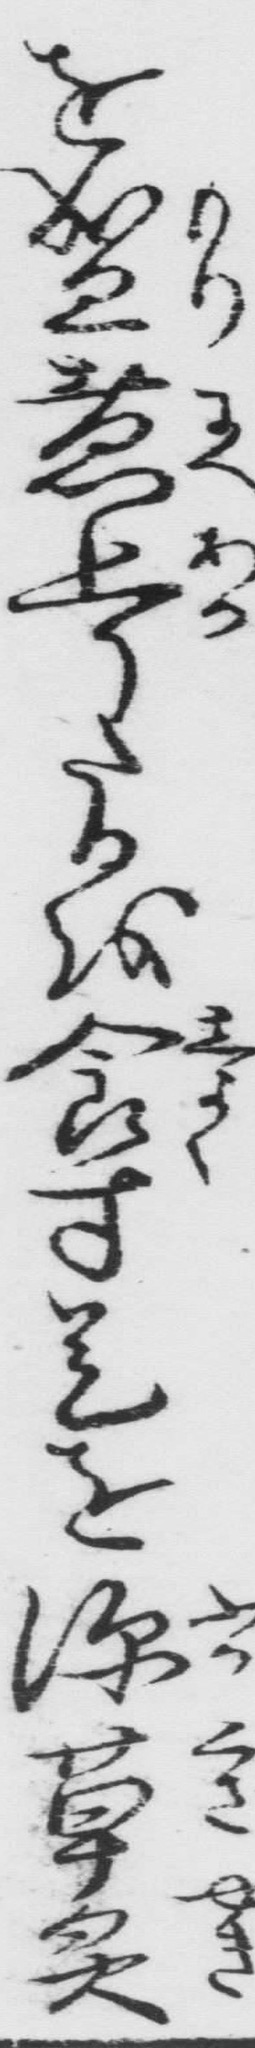を盛煮上りたるを食す是を深草炙
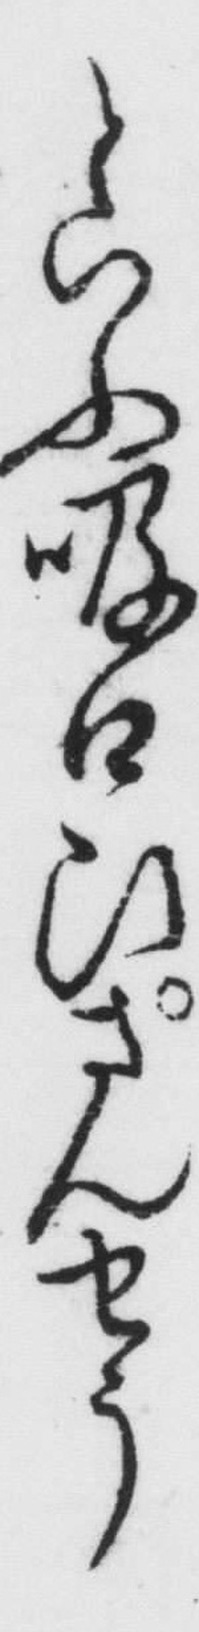といふ吸口ひざんせう
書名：海鰻百珍
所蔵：大阪府立大学学術情報センター 国文学研究資料館
